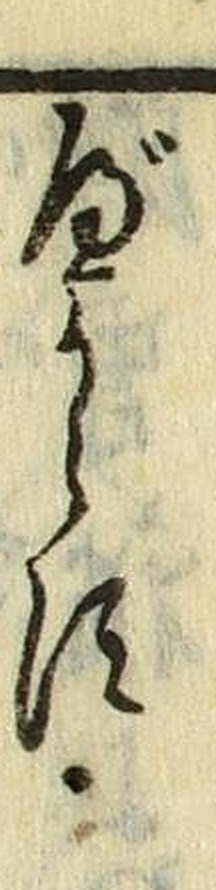べからす
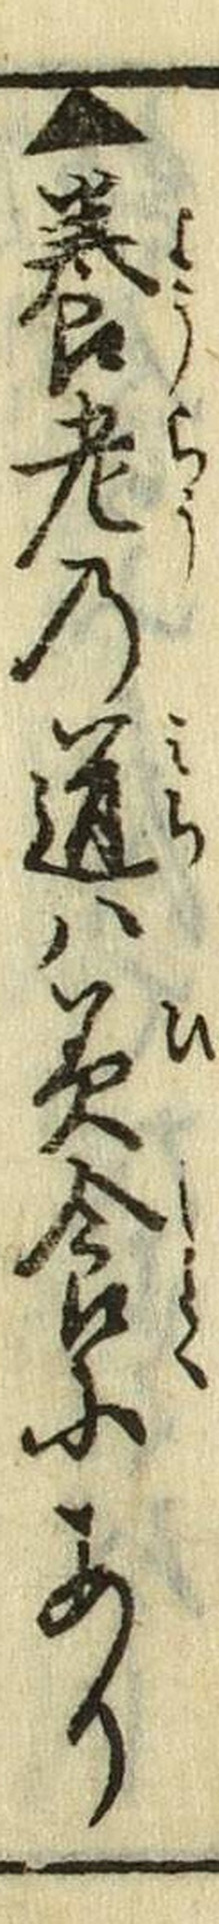▲養老の道は美食にあり
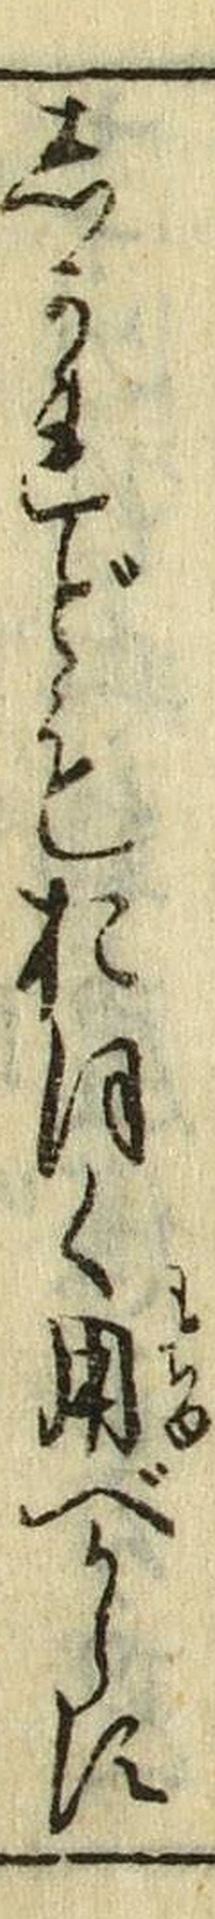しかれどもおほく用べからす

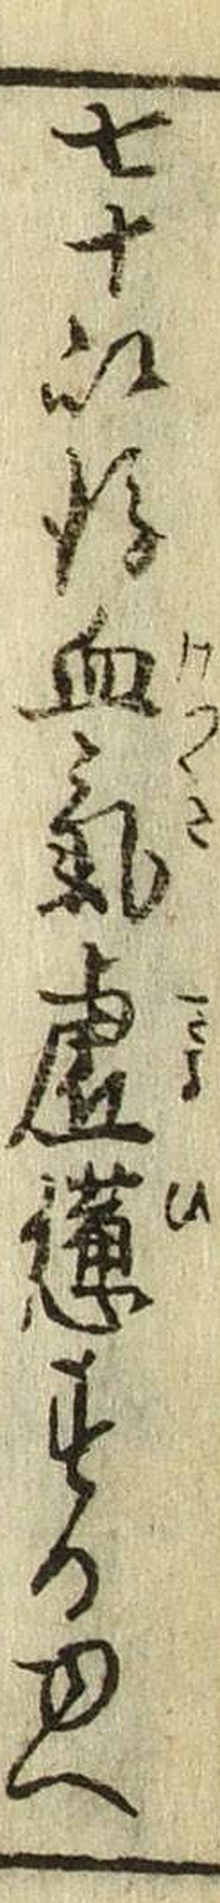七十以後血気虚憊するゆへ
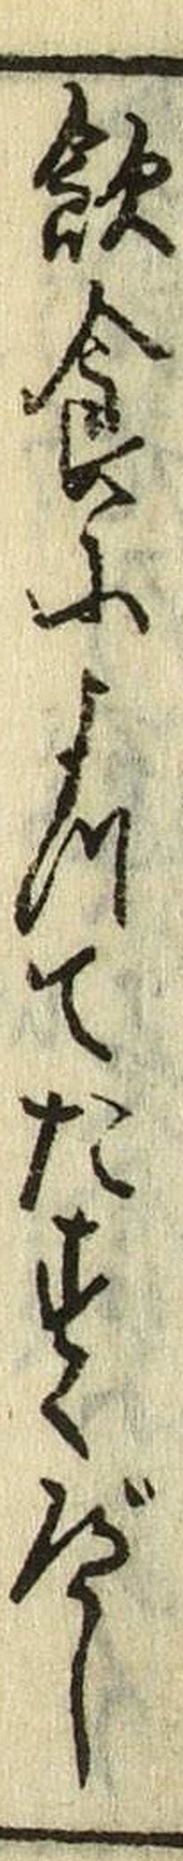飲食によつてたすくべし
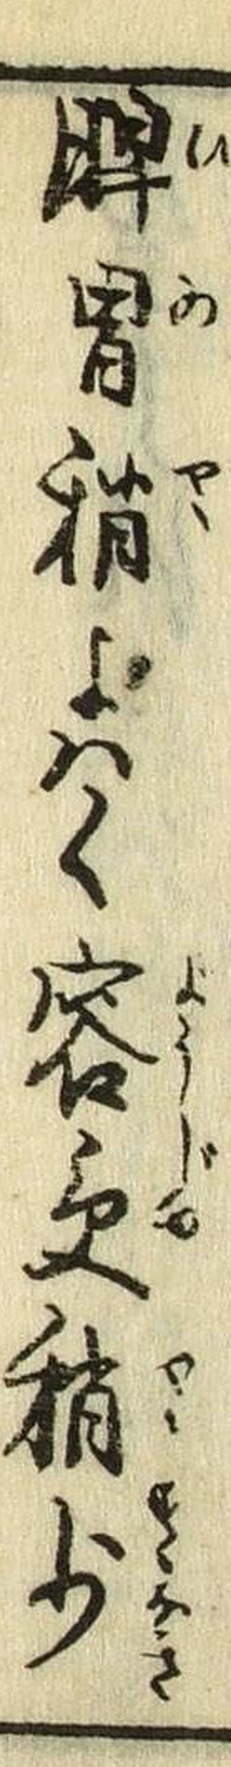脾胃稍よはく容受稍少
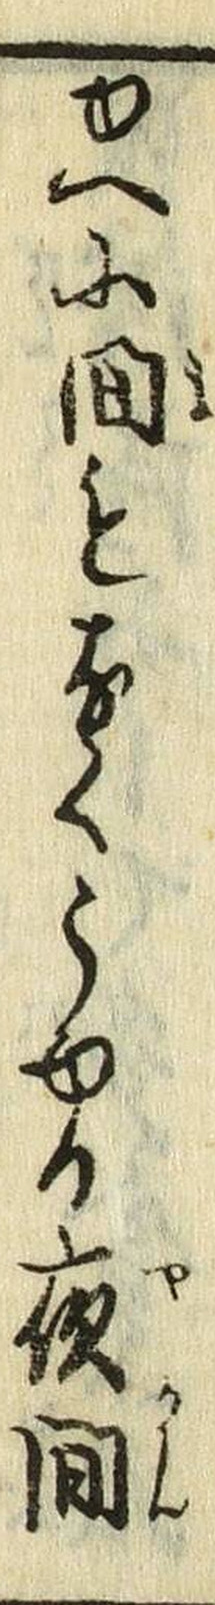ゆへに間もなくうゆる夜間
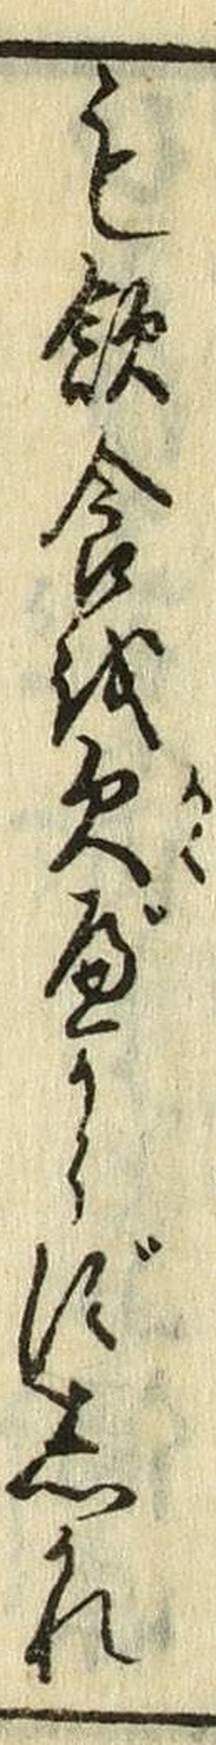も飲食を欠べからずしかれ
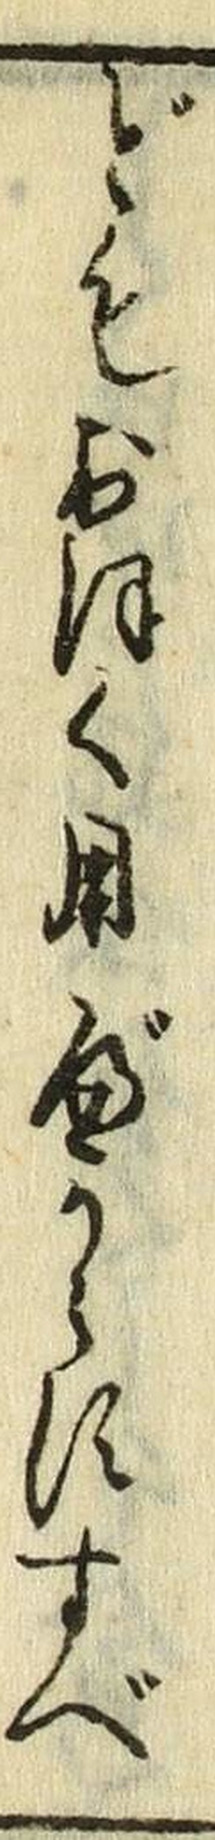どもおほく用べからすすべ
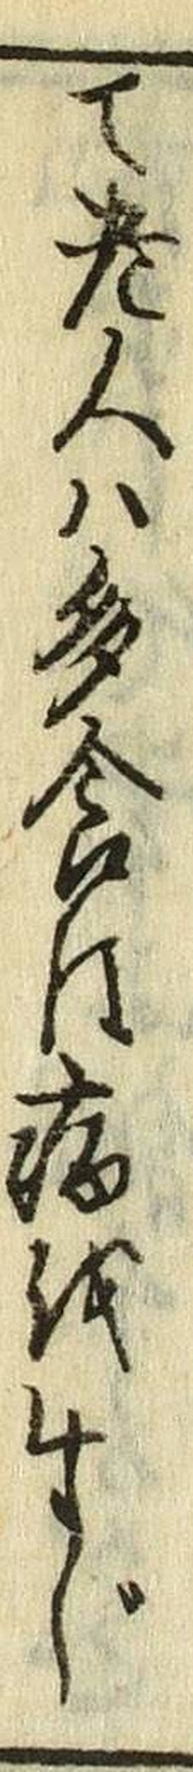て老人は多食は病を生じ
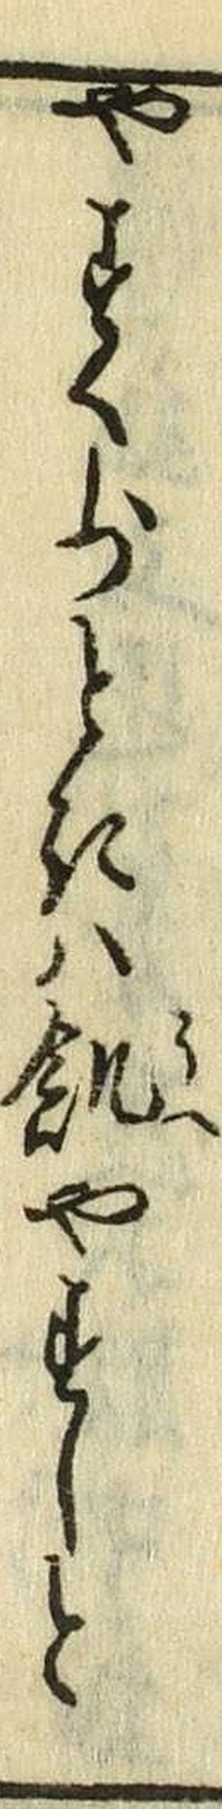やすく少ときは飢やすしと
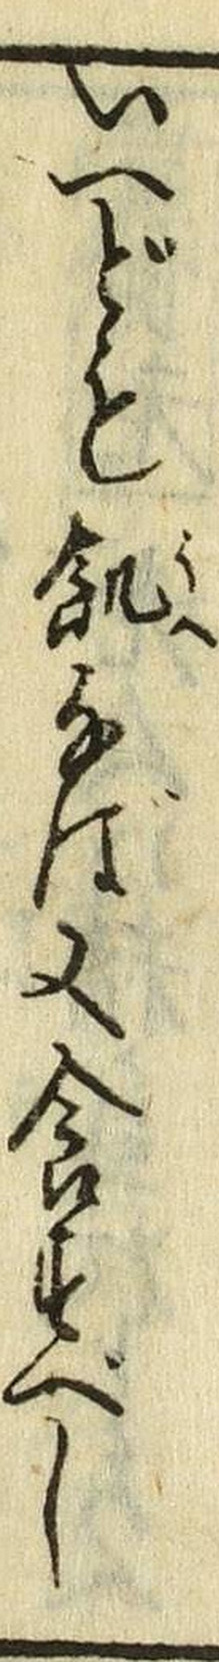いへども飢なば又食すべし
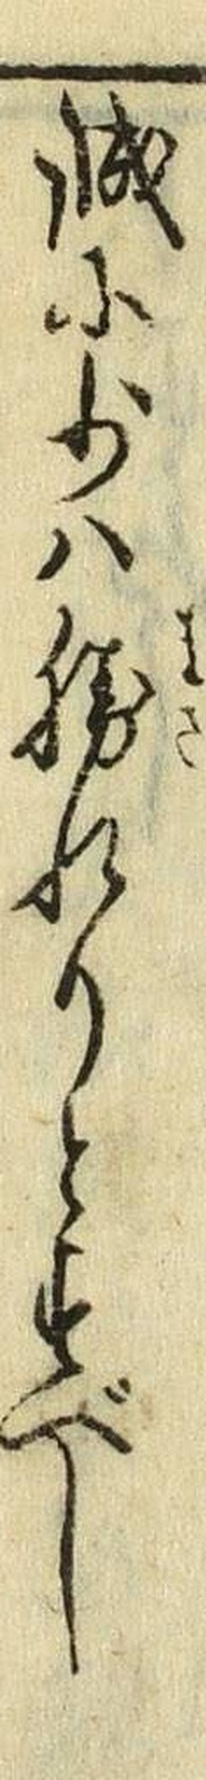誠に少は勝れりとすべし
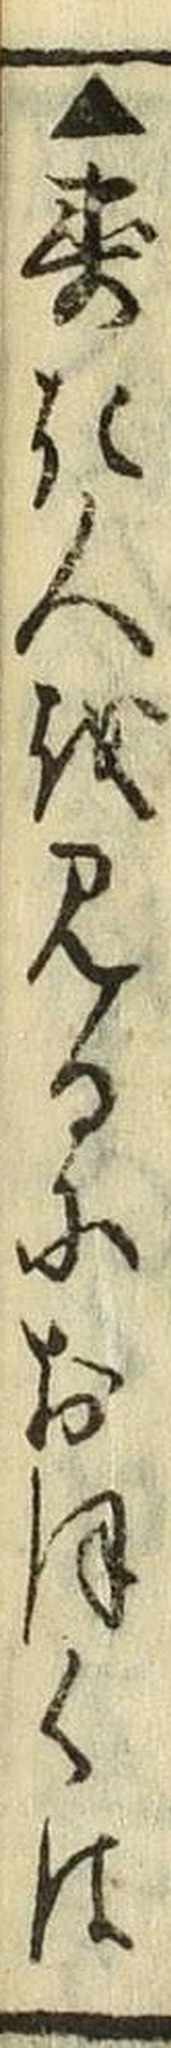▲寿き人を見るにおほくは
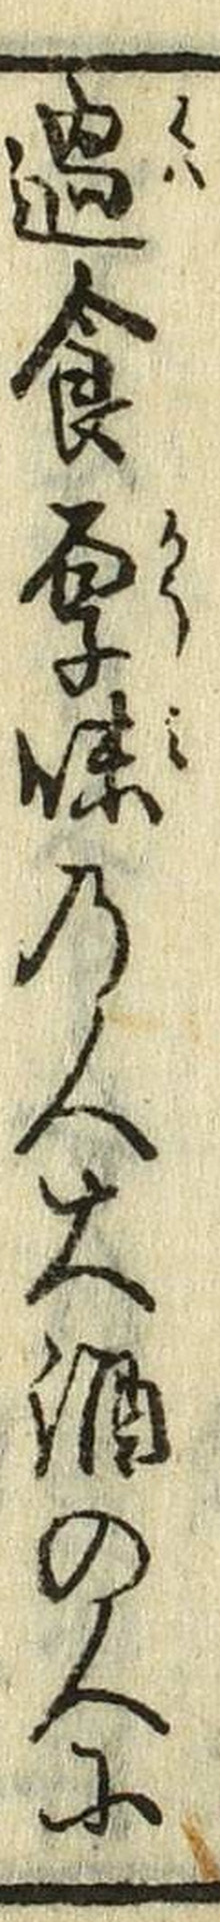過食厚味の人大酒の人に
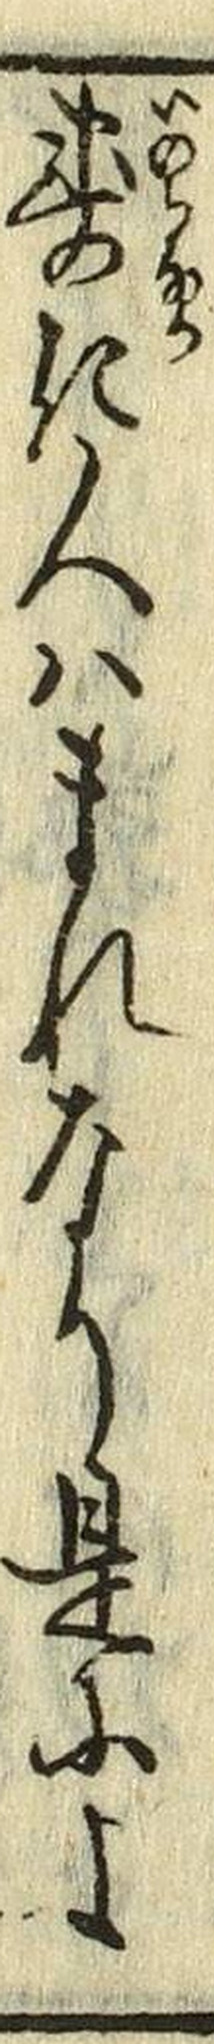寿き人はまれなり是によ
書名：居家養生記
